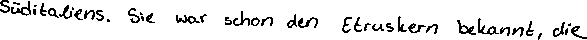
Süditaliens. Sie war schon den Etruskern bekannt, die
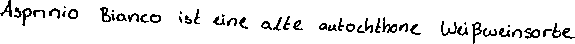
Asprinio Bianco ist eine alte autochthone Weißweinsorte
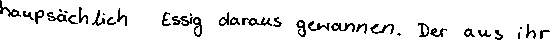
hauptsächlich Essig daraus gewannen. Der aus ihr
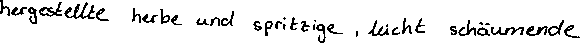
hergestellte herbe und spritzige, leicht schäumende
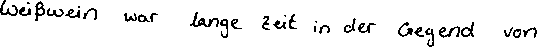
Weißwein war lange Zeit in der Gegend von
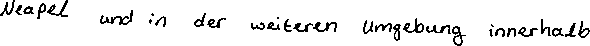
Neapel und in der weiteren Umgebung innerhalb
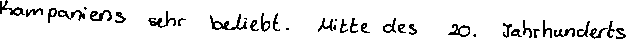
Kampaniens sehr beliebt. Mitte des 20. Jahrhunderts
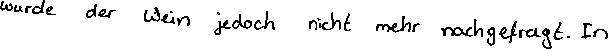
wurde der Wein jedoch nicht mehr nachgefragt. In
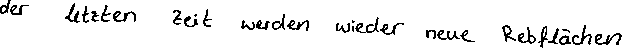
der letzten Zeit werden wieder neue Rebflächen
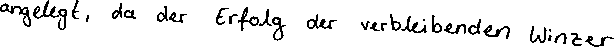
angelegt, da der Erfolg der verbleibenden Winzer
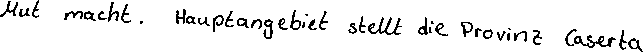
Mut macht. Hauptangebiet stellt die Provinz Caserta
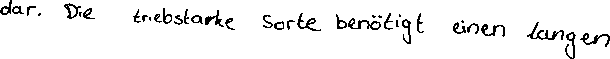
dar. Die triebstarke Sorte benötigt einen langen
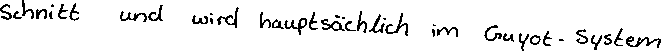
Schnitt und wird hauptsächlich im Guyot-System
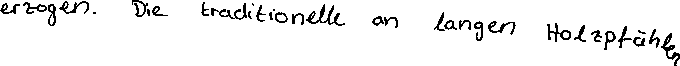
erzogen. Die traditionelle an langen Holzpfählen
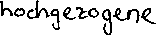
hochgezogene
